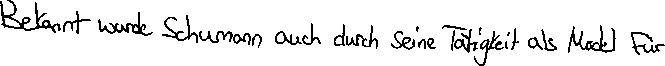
Bekannt wurde Schumann auch durch seine Tätigkeit als Model für
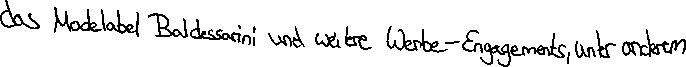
das Modelabel Baldessarini und weitere Werbe-Engagements, unter anderem
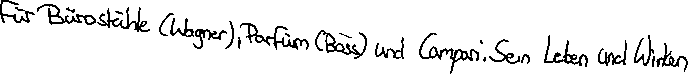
für Bürostühle (Wagner), Parfüm (Boss) und Campari. Sein Leben und Wirken
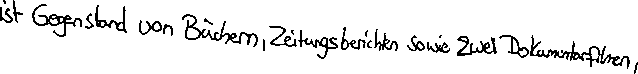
ist Gegenstand von Büchern, Zeitungsberichten sowie zwei Dokumentarfilmen,
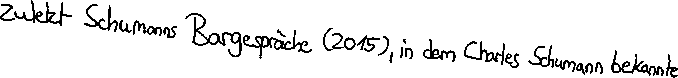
zuletzt Schumanns Bargespräche (2015), in dem Charles Schumann bekannte
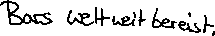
Bars weltweit bereist.
